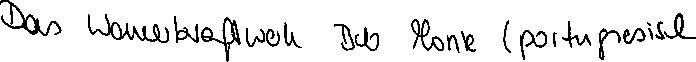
Das Wasserkraftwerk Belo Monte (portugiesisch
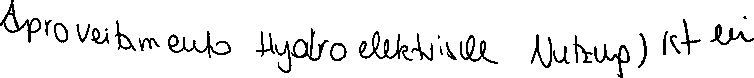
Aproveitamento Hydroelektrische Nutzung) ist ein
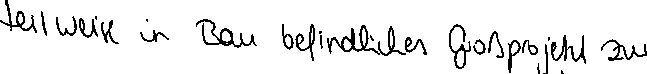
teilweise in Bau befindliches Großprojekt zur
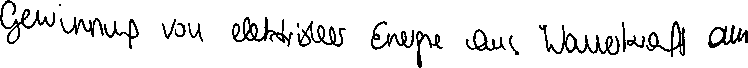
Gewinnung von elektrischer Energie aus Wasserkraft am
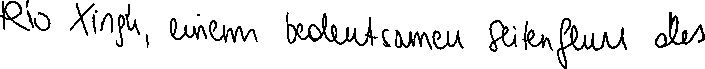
Rio Xingu, einem bedeutsamen Seitenfluss des
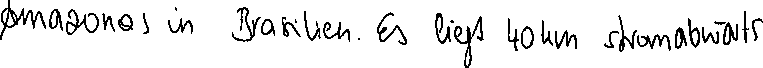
Amazonas in Brasilien. Es liegt 40 km stromabwärts
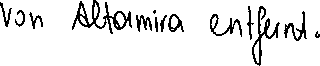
von Altamira entfernt.
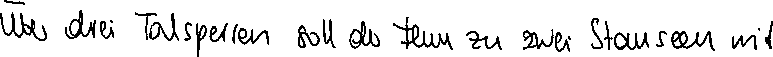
Über drei Talsperren soll der Fluss zu zwei Stauseen mit
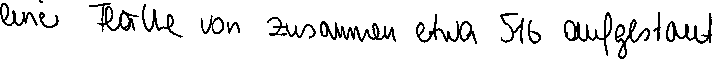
einer Fläche von zusammen etwa 516 aufgestaut
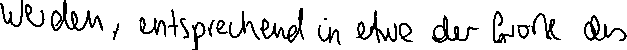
werden, entsprechend in etwa der Größe des
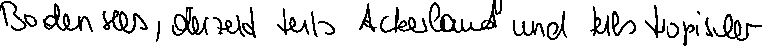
Bodensees, derzeit teils Ackerland und teils tropischer
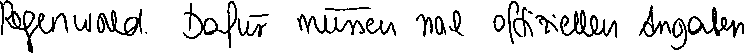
Regenwald Dafür müssen nach offiziellen Angaben
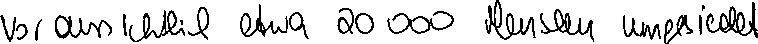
voraussichtlich etwa 20.000 Menschen umgesiedelt
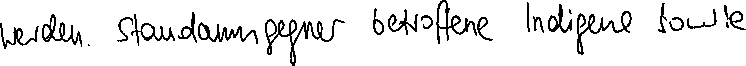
werden. Staudammgegner betroffene Indigene sowie
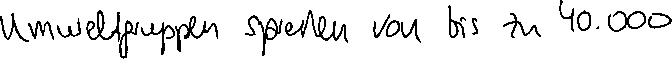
Umweltgruppen sprechen von bis zu 40.000
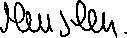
Menschen.
